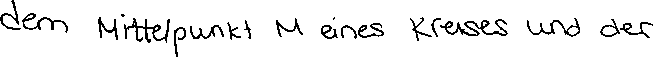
dem Mittelpunkt M eines Kreises und der
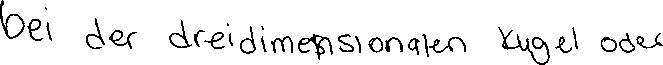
bei einer dreidimensionalen Kugel oder
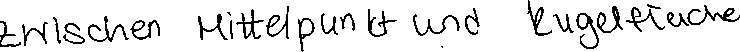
zwischen Mittelpunkt und Kugelfläche
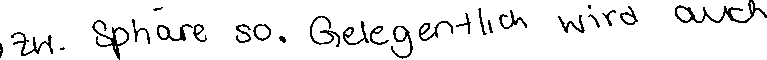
zw. Sphäre so. Gelegentlich wird auch
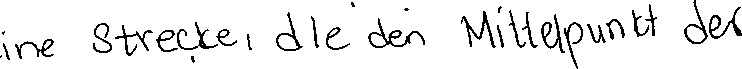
ine Strecke, die den Mittelpunkt der
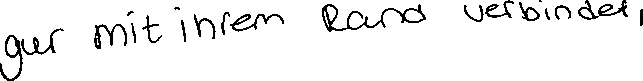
gur mit ihrem Rand verbindet,
